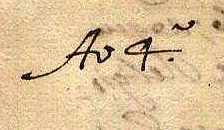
Ao 4.o
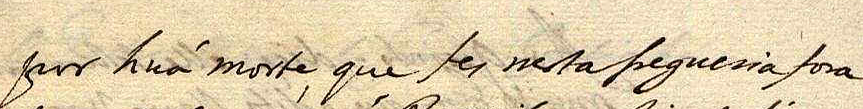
por huā morte, que fes nesta freguezia fora
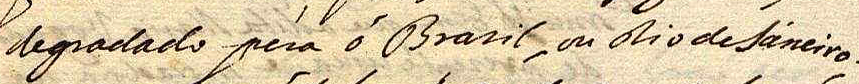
degradado pera o Brazil, ou Rio de Ianeiro.
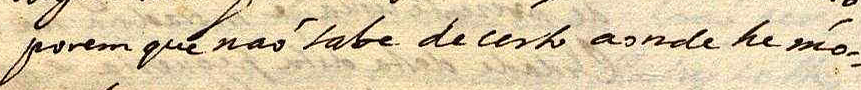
porem que naõ sabe de certo aonde he mo
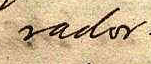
rador.
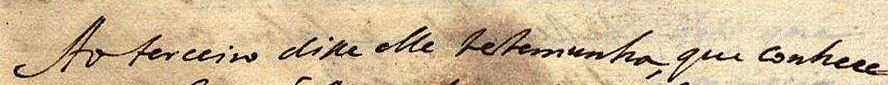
Ao terceiro disse elle testemunha, que conhece
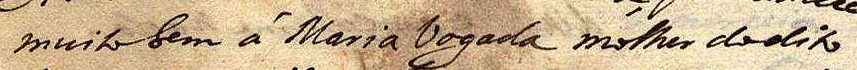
muito bem á Maria Vogada molher do dito
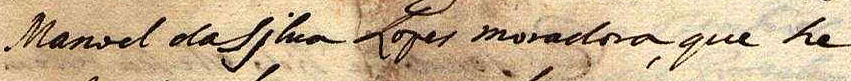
Manoel da Sjlua Lopes moradora que he
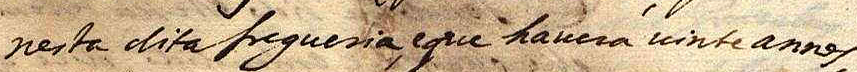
nesta dita freguezia, e que hauera uinte annos,
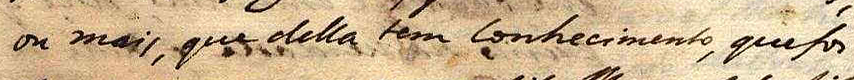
ou mais, que della tem conhecimento, que foi
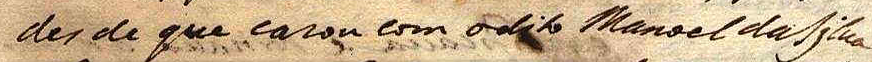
desde que cazou com o dito Manoel da Sjlua
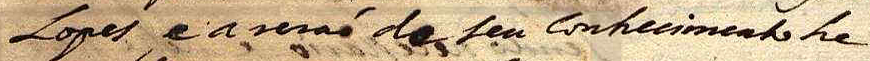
Lopes, e a rezaõ de seu conhecimento he
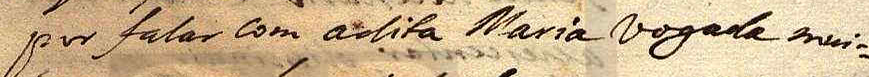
por falar com a dita Maria Vogada mui
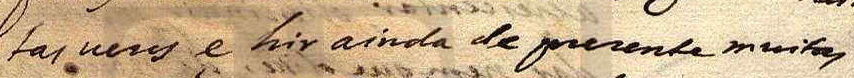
tas uezes, e hir ainda de prezente muitas
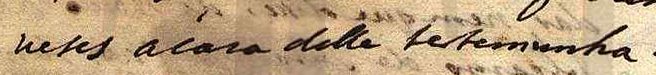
ueses a caza delle testemunha.
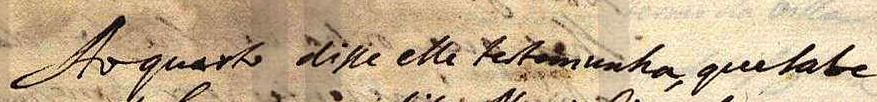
Ao quarto disse elle testemunha, que sabe
